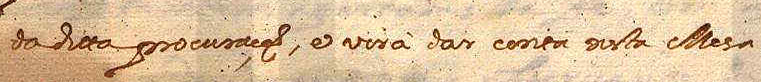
da ditta procuraçaõ, e vira dar conta nesta Mesa
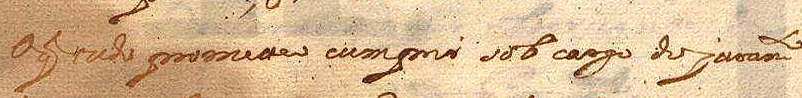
O q̄ tudo prometteo cumprir sob cargo do juramto
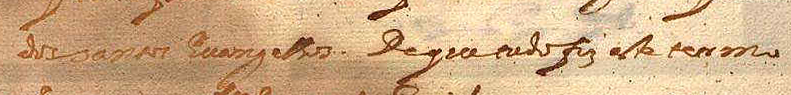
dos santos Euangelhos. De que tudo fiz este termo
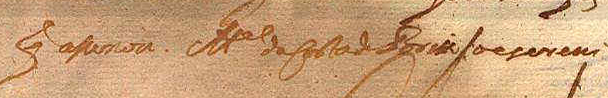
q̄ asinou. Mel da Costa Britto o escreui
